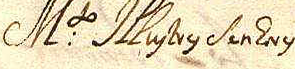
M:to Illustres Senhores
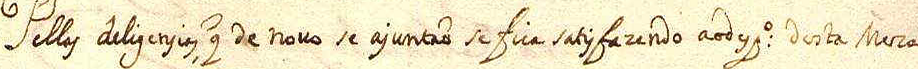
Pellas deligensias, q̄ de nouo se ajuntaõ se fica satisfazendo ao despo. desta Meza
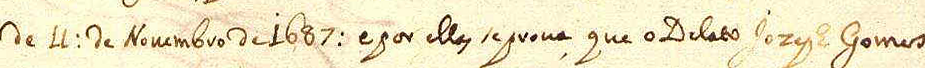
de 11: de Nouembro de 1687: e por ellas se proua, que o Delato Jozeph Gomes
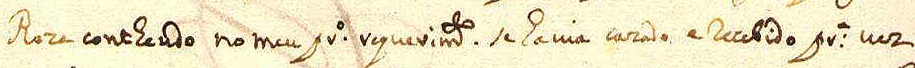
Roza contheudo no pro. requerimto. se hauia cazado e recebido pra: uez
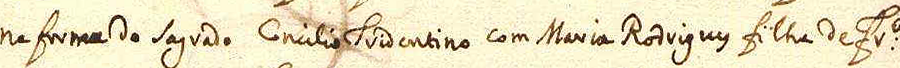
na forma do Sagrado Concilio Tridentino com Maria Rodrigues filha de Frco:
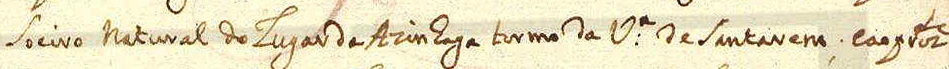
Soeiro natural do Lugar da Azinhaga termo da Ua: de Santarem; e ao prezte
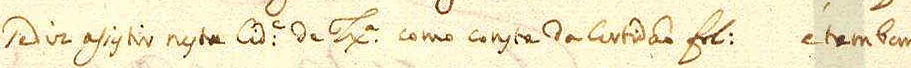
se diz assistir nesta Cid:e de Lxa. como consta da Certidaõ fol: e tambem
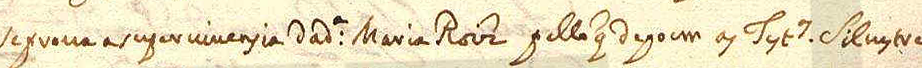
se proua a superuiuensia da da: Maria Roiz̄ pello q̄ depoem as Testas. Siluestre
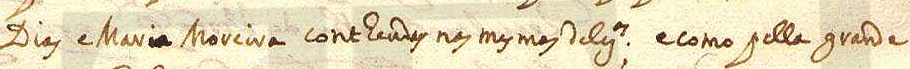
Dias e Maria Moreira contheudas nas mesmas delegas. e como pella grande
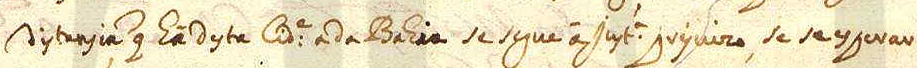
distansia q̄ há desta Cide: a da Bahia se segue à Justa. prejuizo, se se esperar
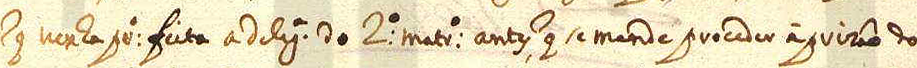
q̄ uenha pro: feita a delega. do 2o: matro: antes, q̄ se mande proceder à prizaõ do
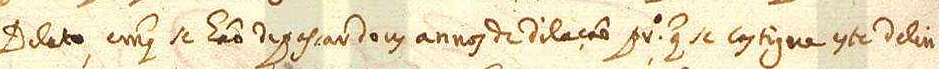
Delato, em q̄ se haõ de passar dous annos de dilaçaõ pro., q̄ se castigue este delin
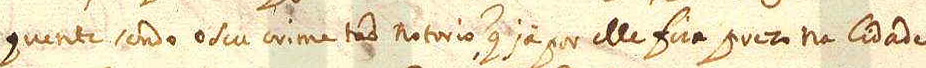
quente sendo o seu crime notorio, q̄ ja por elle fora prezo na Cidade
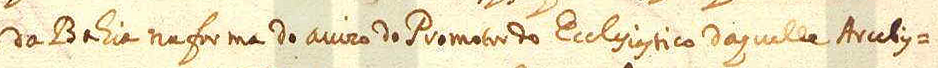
da Bahia na forma do auizo do Promotor Ecclesiastico daquelle Arcebis
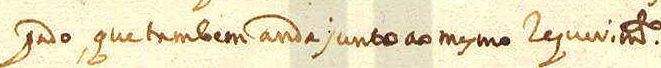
pado, que tambem anda junto ao mesmo Requerimto.
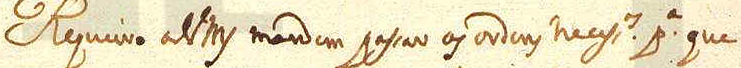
Requeiro a V Ms mandem passar as ordens necessas. pa. que
